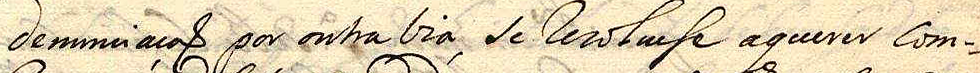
denunciaçaõ por outra via, se Resolvese a querer Com
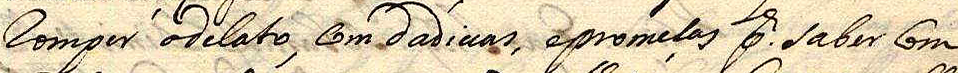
Romper o delato, Com dadiuas, e promeças p̄o. saber Com
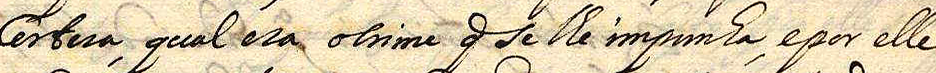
Certeza, qual era o crime q̄ se lhe impunha, e por elle
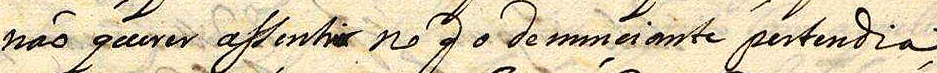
naõ querer assentir no q̄ o denunçiante pertendia,
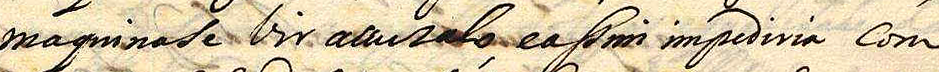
maquinase vir accuzalo, e assim impediria Com
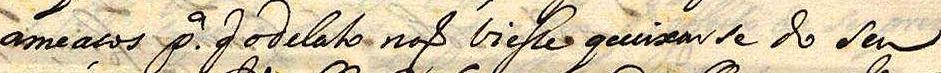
ameaças pa. q̄ o delato naõ viesse queixarse do seu
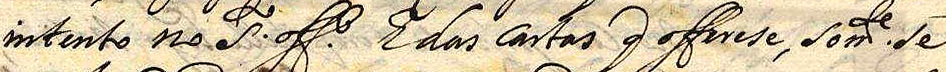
intento no sto. off.o E das Cartas q̄ offerese, somte. se
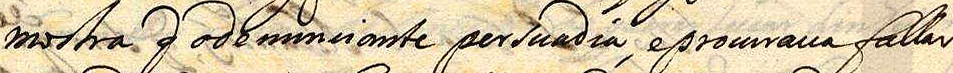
mostra q̄ o denunciante persuadia, e procuraua fallar
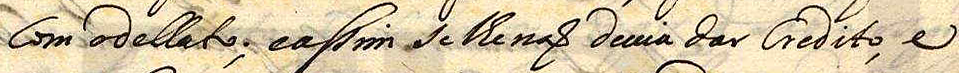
Com o dellato, e assim se lhe naõ deuia dar Credito, e
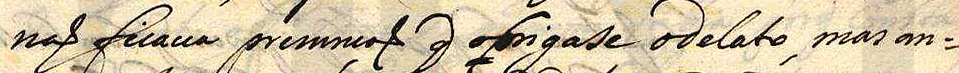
naõ ficaua presunçaõ q̄ obrigase o delato, mas an
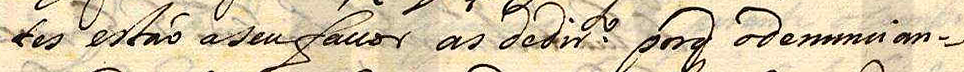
tes estaõ a seu fauor as de dirto. porq̄ o denuncian
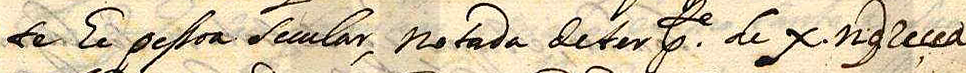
te he pessoa secular, notada de ter pte. de x. n q̄ reçea
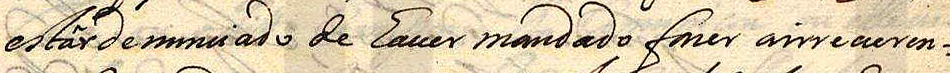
estâr denunciado de hauer mandado fazer a irreueren
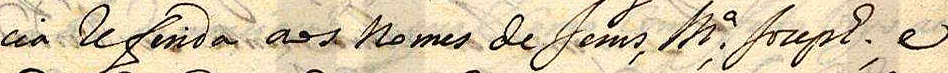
cia Referida aos nomes de Jesus, M.a, Jozeph. e
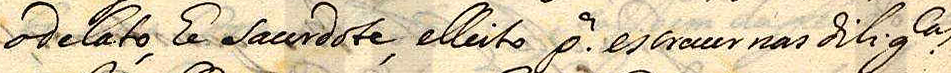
o delato, he sacerdote, elleito p.a escreuer nas diligcas.
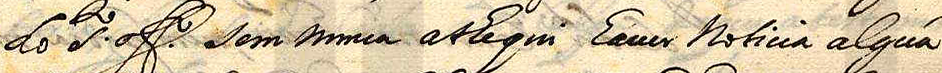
do sto. off.o sem nunca athe qui hauer noticia alguā
